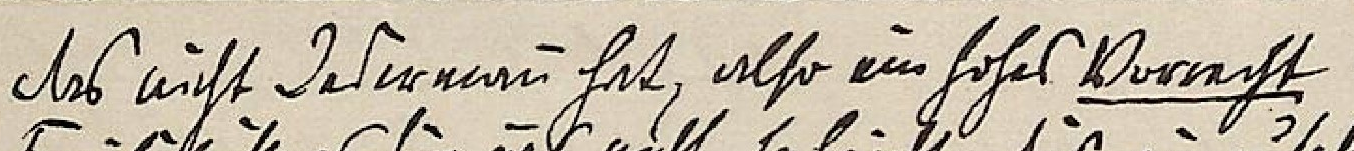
das nicht Jederman hat, also ein hohes Vorrecht.
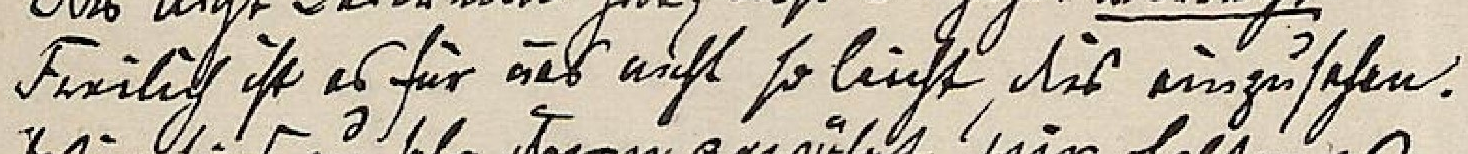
Freilich ist es für uns nicht so leicht dies einzusehen:
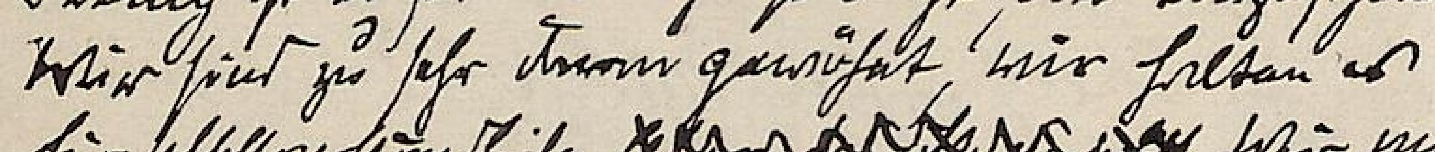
Wir sind zu sehr daran gewöhnt, wir halten es
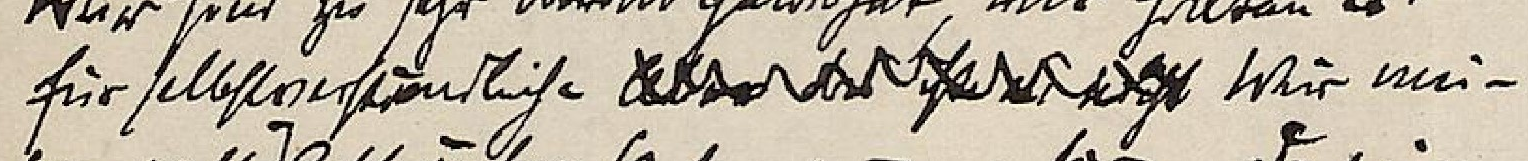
für selbstverständliche. Aber das ist es nicht. Wir mei¬
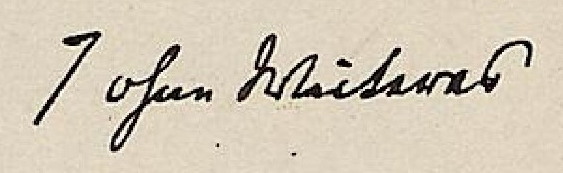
] ohne Weiteres
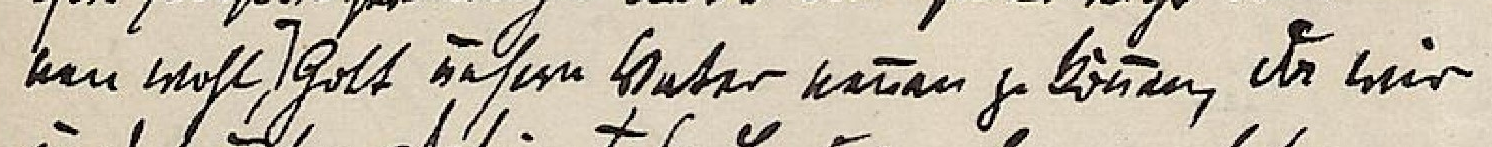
nen wohl, ] Gott unsern Vater nenen zu könen, dawir
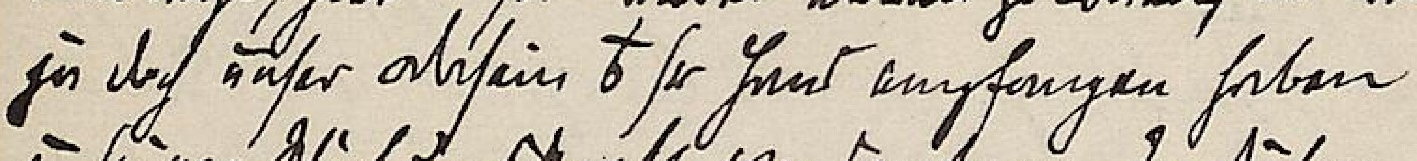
ja doch unser Dasein s sr Hand empfangen haben
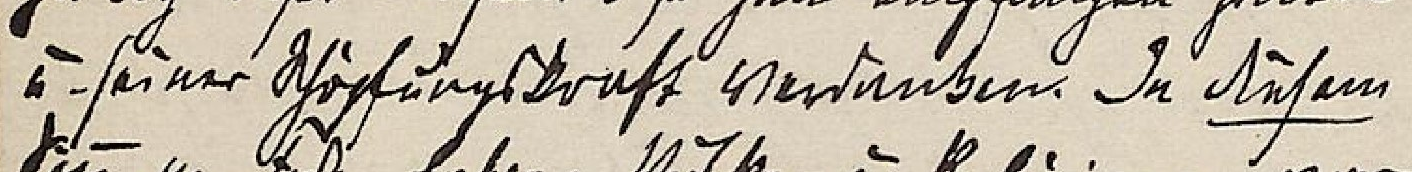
und seiner Schöpfungskraft verdanken. In diesem
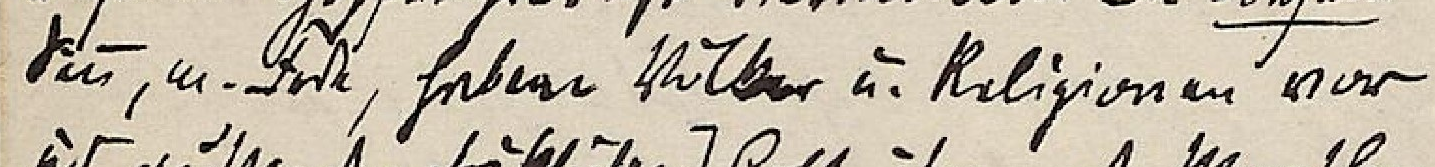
Sin, m. Frde, haben Völker u. Religionen vor
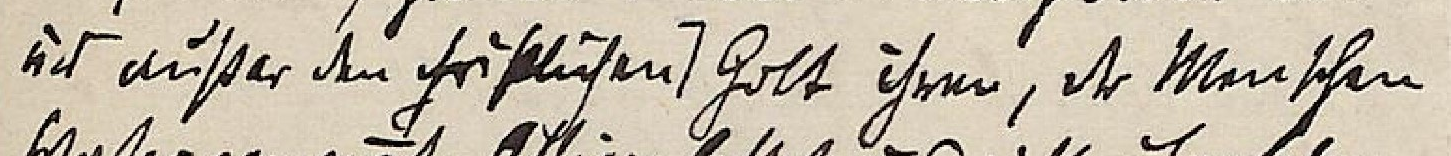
uns außer den christlichen] Gott ihren, der Menschen
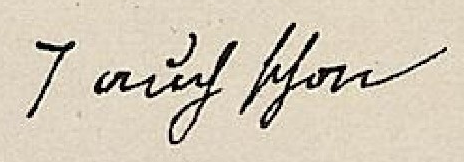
] auch schon
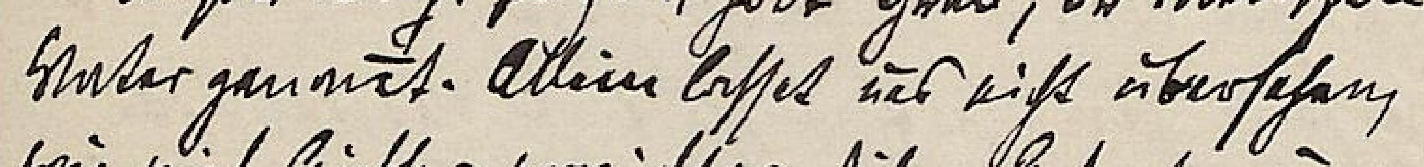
Vater genant. Allein lasst uns nicht übersehen,
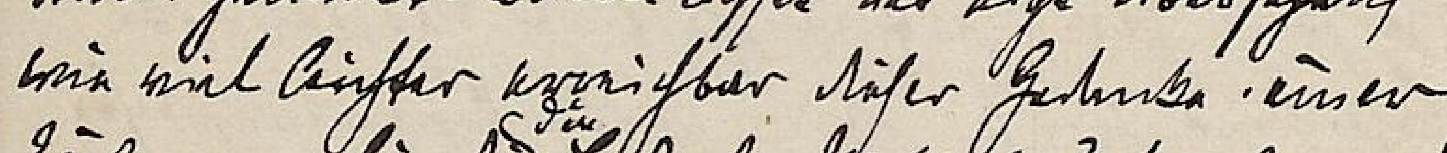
wie viel leichter erreichbar dieser Gedanke einer
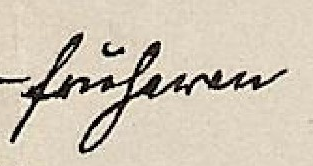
früheren
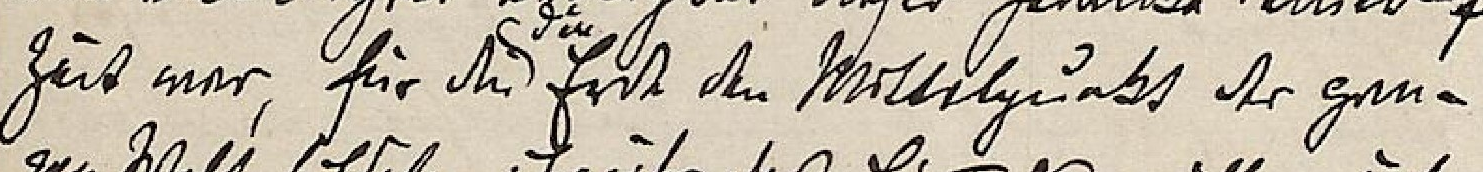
Zeit war, dür die Erde den Mittelpunkt der gan¬
